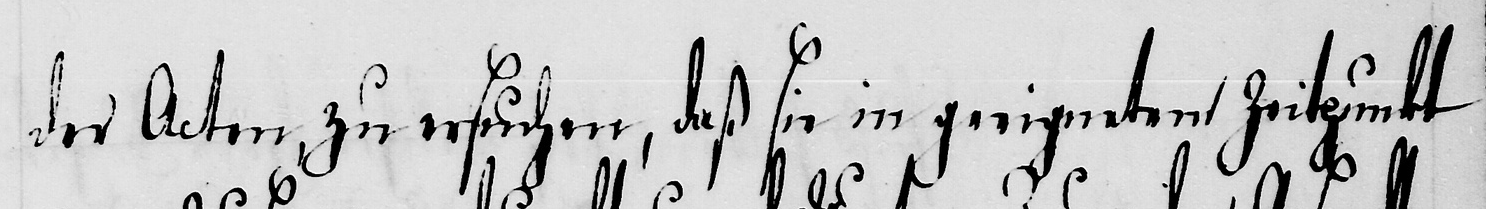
der Acten, zu ersuchen, daß sie in geeignetem Zeitpunkt
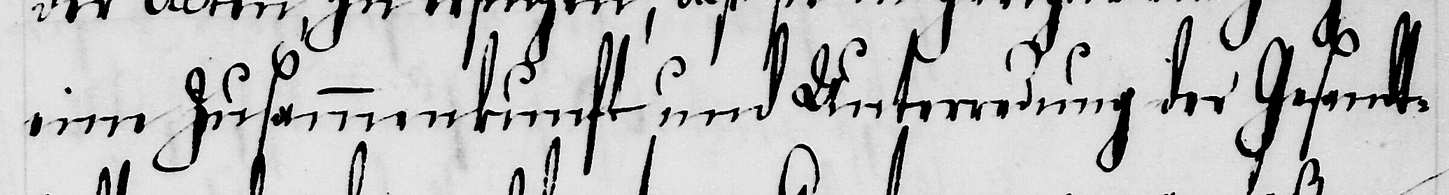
eine Zusammenkunft und Unterredung der Gesandt¬
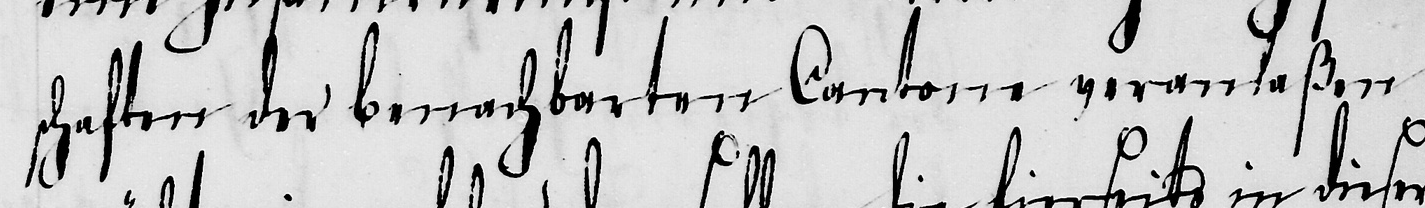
schaften der benachbarten Cantone veranlaßen
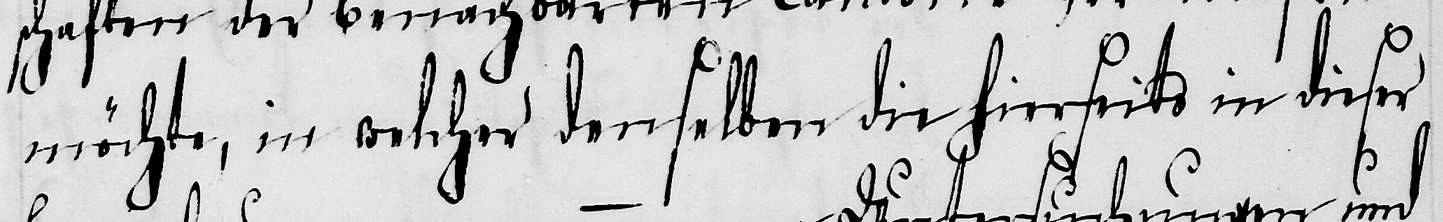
möchte, in welcher denselben die hierseits in dies¬
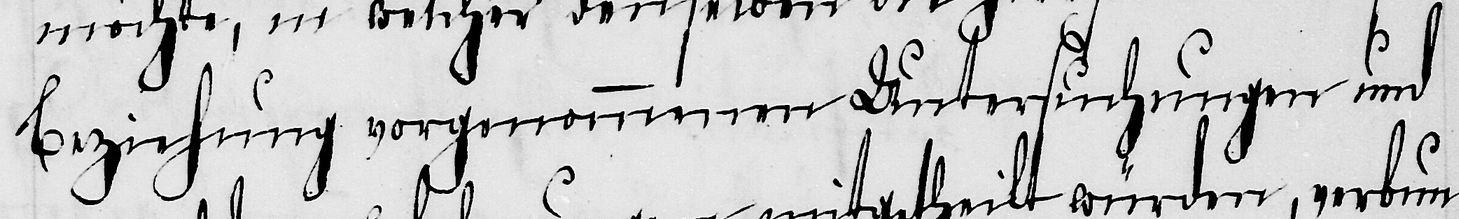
Beziehung vorgenommenen Untersuchungen und
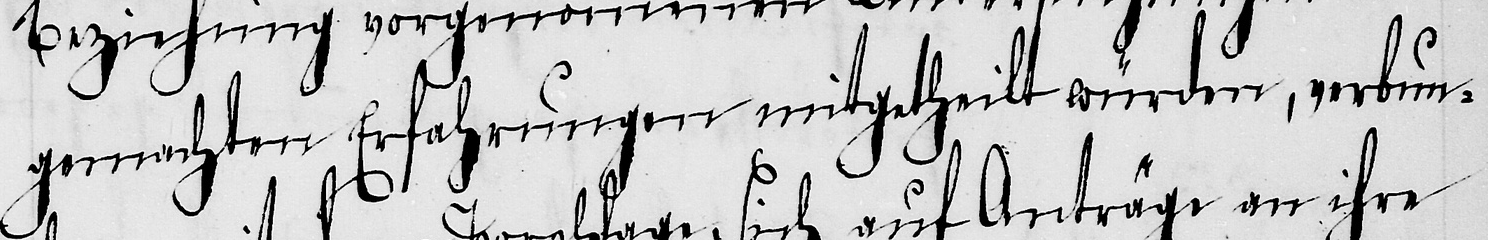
gemachten Erfahrungen mitgetheilt würden, verbun¬
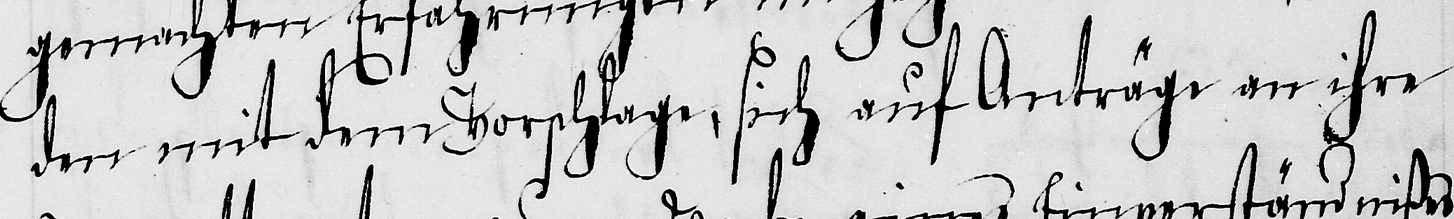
den mit dem Vorschlage, sich auf Anträge an ihre
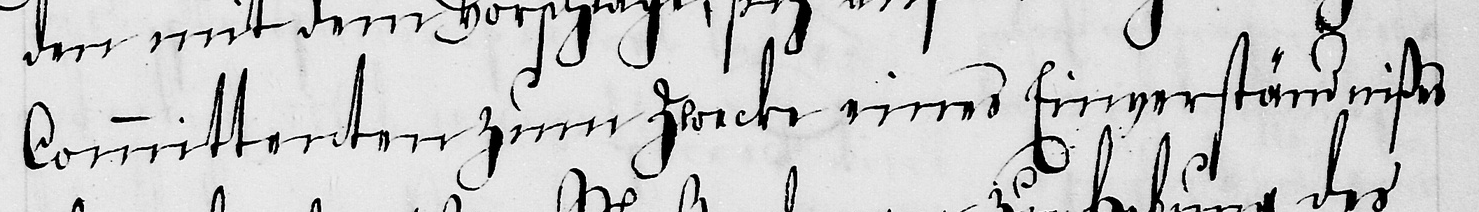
Committenten zum Zwecke eines Einverständnißes
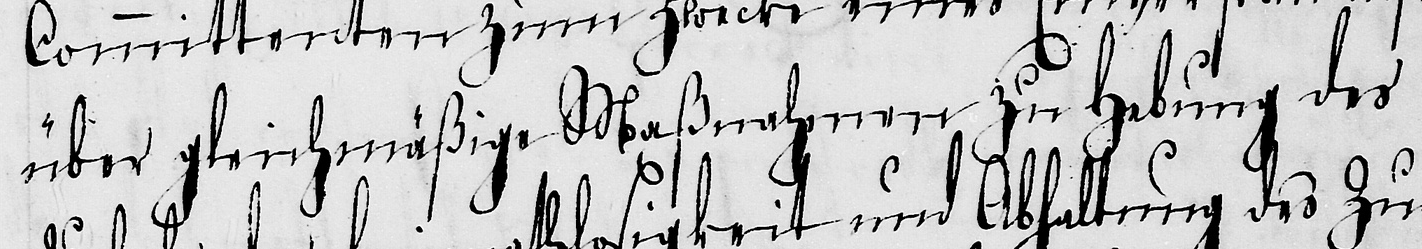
über gleichmäßige Maßnahmen zu Hebung des
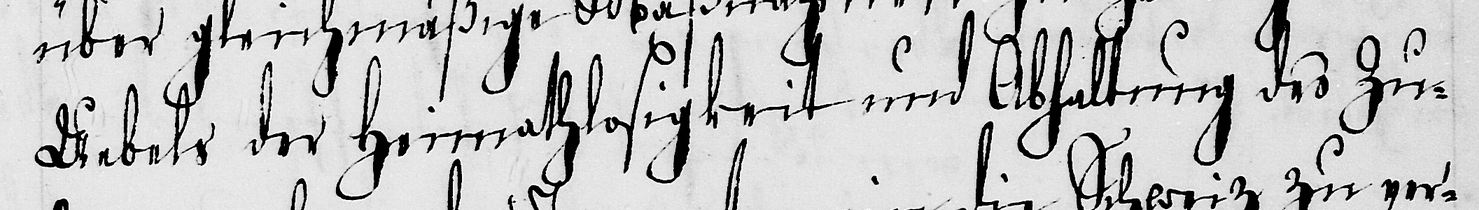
Uebels der Heimathlosigkeit und Abhaltung des Zu¬
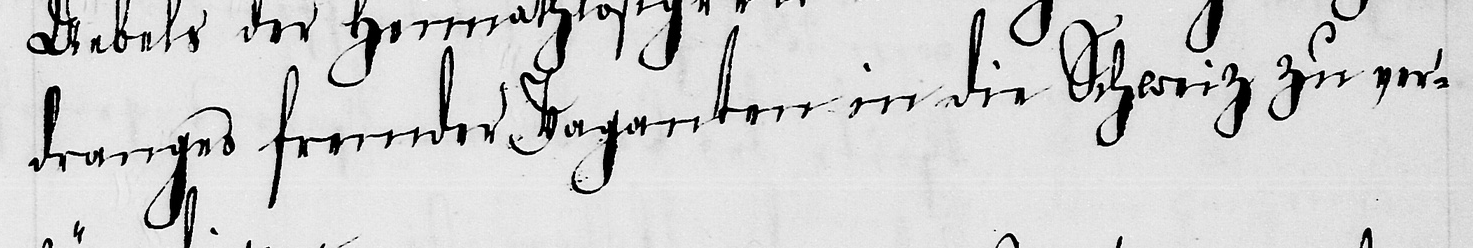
dranges fremder Vaganten in die Schweiz zu ver¬
